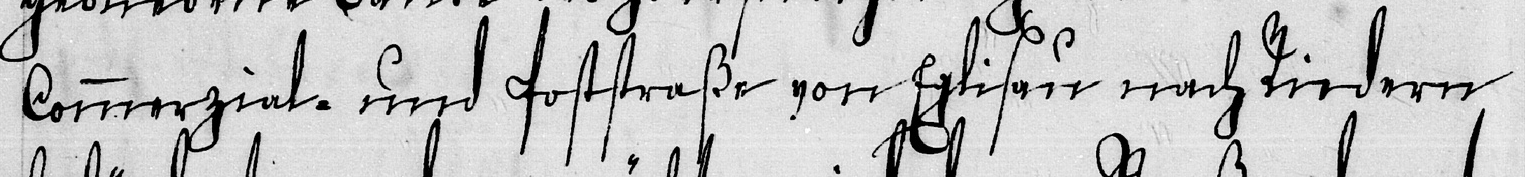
Commerzial- und Poststraße von Eglisau nach Lindern
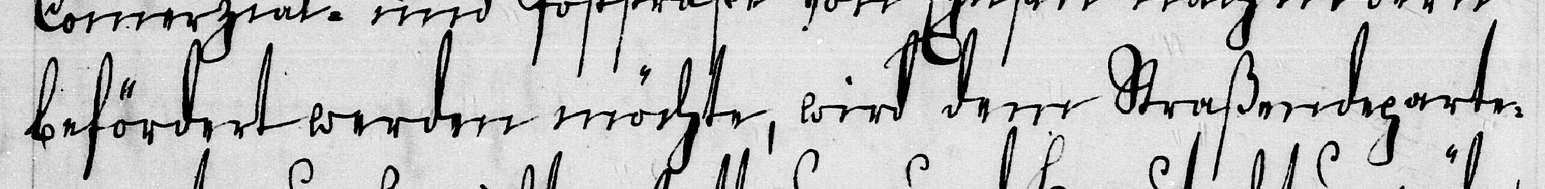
befördert werden möchte, wird dem Straßendeparte¬
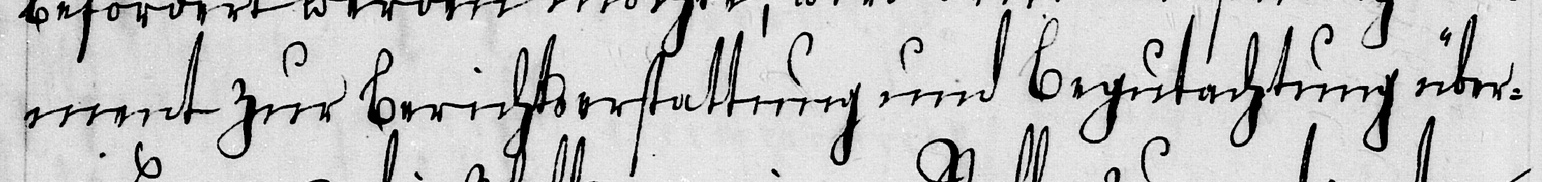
ment zur Berichterstattung und Begutachtung über¬
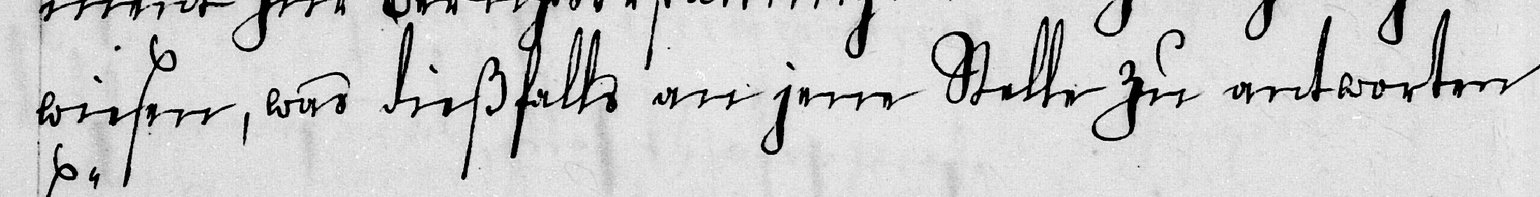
wiesen, was dießfalls an jene Stelle zu antworten
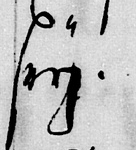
sey.
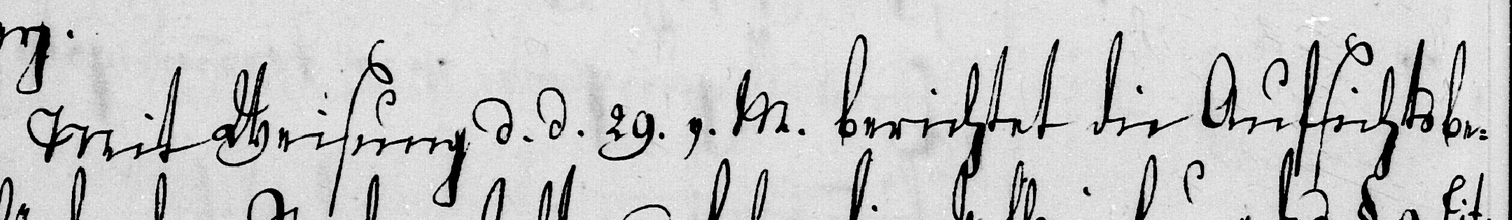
Mit Weisung d. d. 29. v. M. berichtet die Aufsichtsbe¬
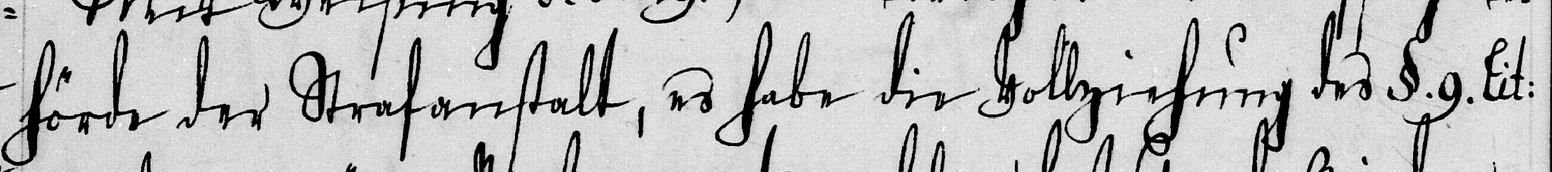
hörde der Strafanstalt, es habe die Vollziehung des §. 9.
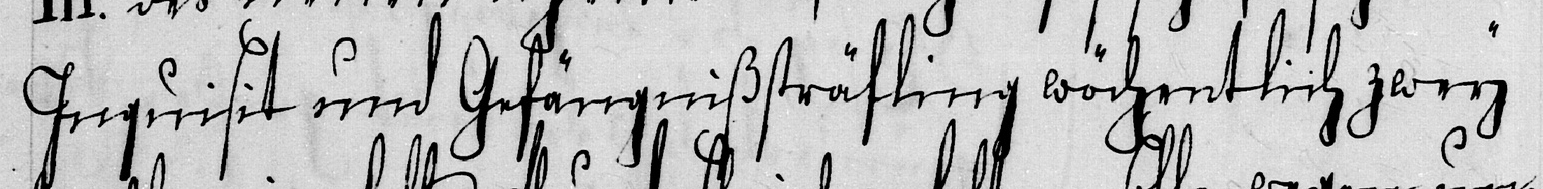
Inquisit und Gefängnißsträfling wöchentlich zwey
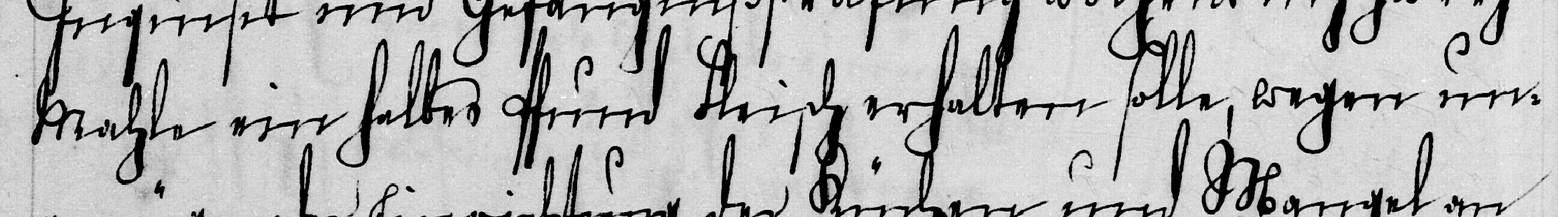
Mahle ein halbes Pfund Fleisch erhalten solle, wegen un¬
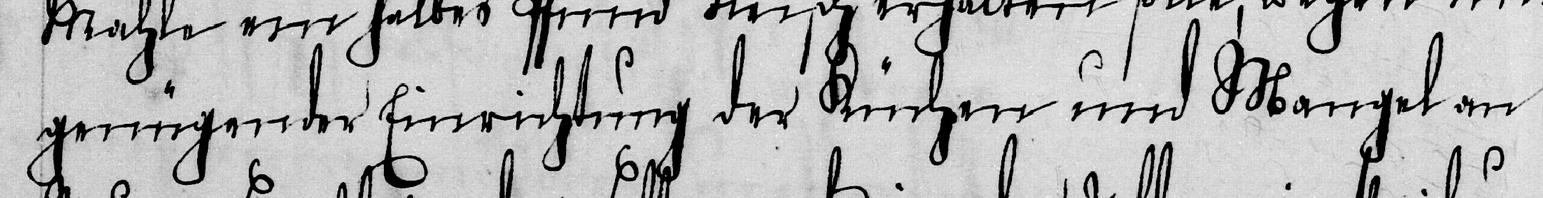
genügender Einrichtung der Küchen und Mangel an
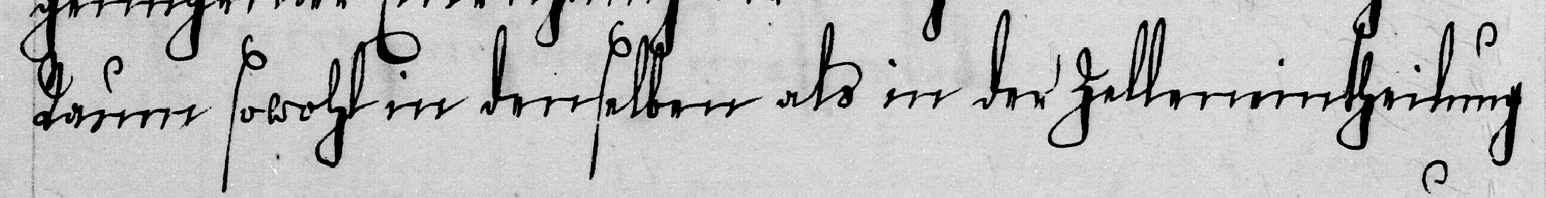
Raum sowohl in denselben als in der Zelleneintheilung
